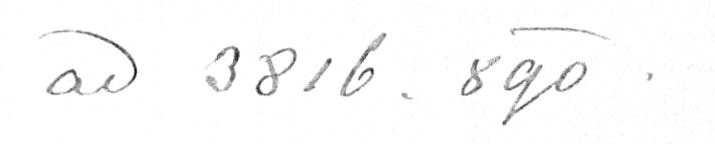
ad 3816. 890.
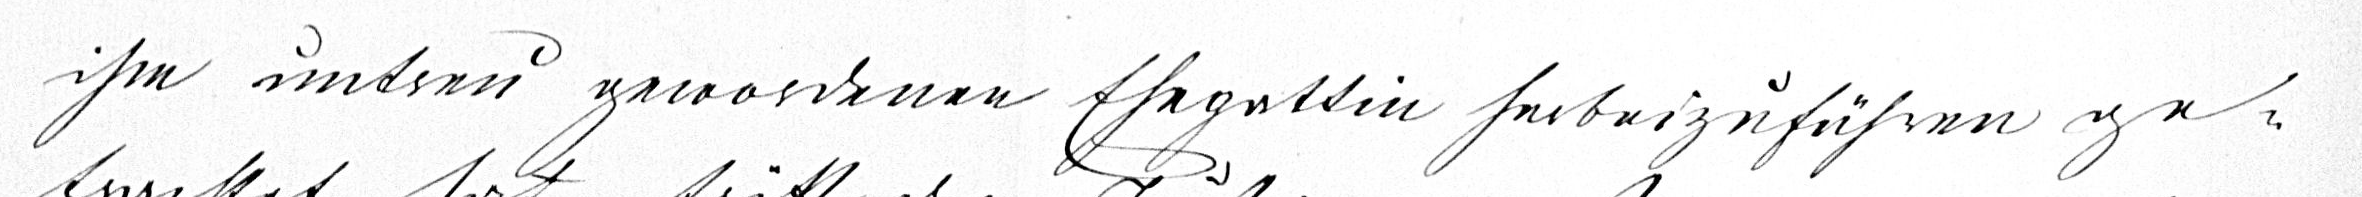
ihm untreu gewordenen Ehegattin herbeizufähren ge¬
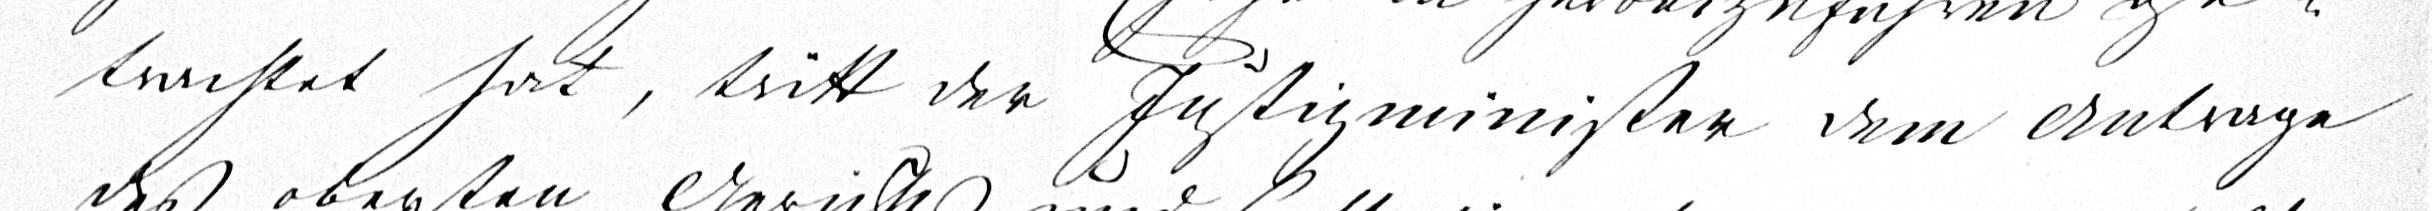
trachtet hat, tritt der Justizminister dem Antrage
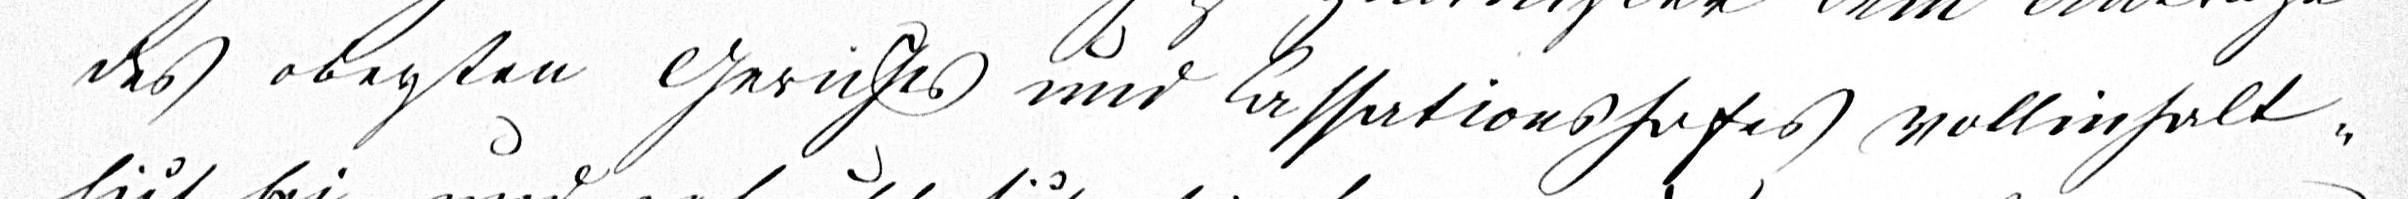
des obersten Gerichts und Cassationshofes vollinhal¬
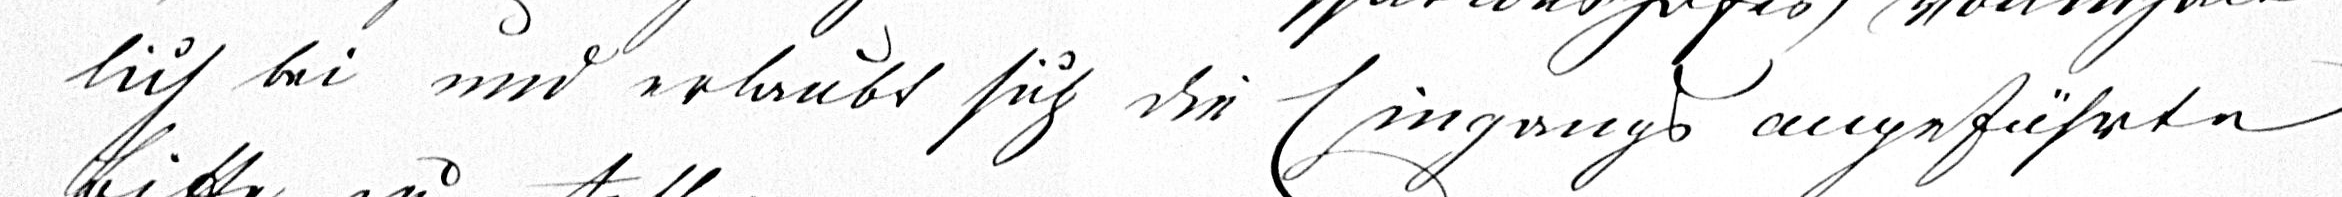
lich bei und erlaubt sich die Eingangs angeführte
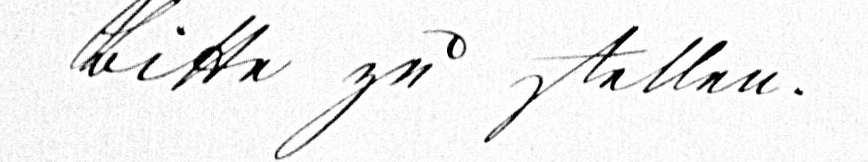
bitte zu stellen.
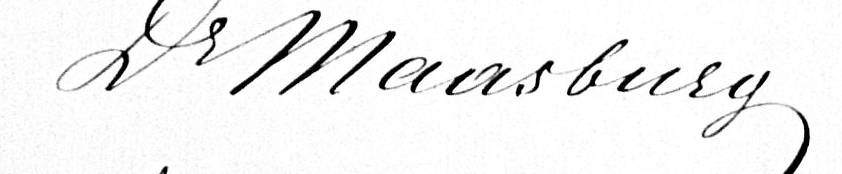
Dr Maasburg
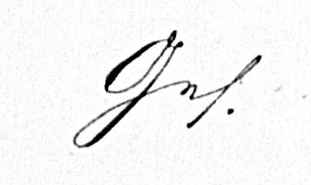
Ges.
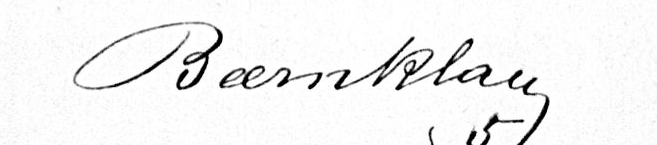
Barnklau
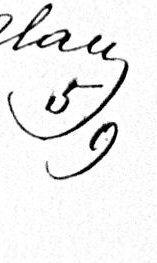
5/9
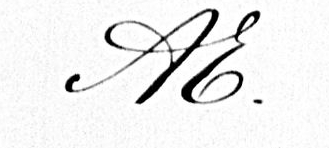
AE.
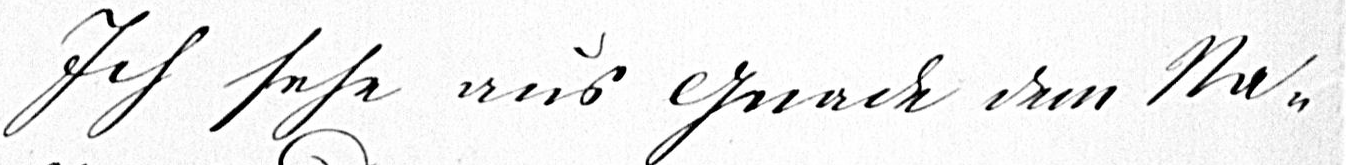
Ich sehe aus Gnade dem Na¬
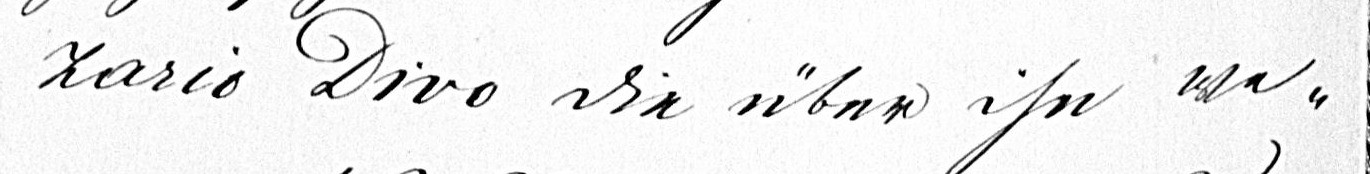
zario Divo die über ihn we¬
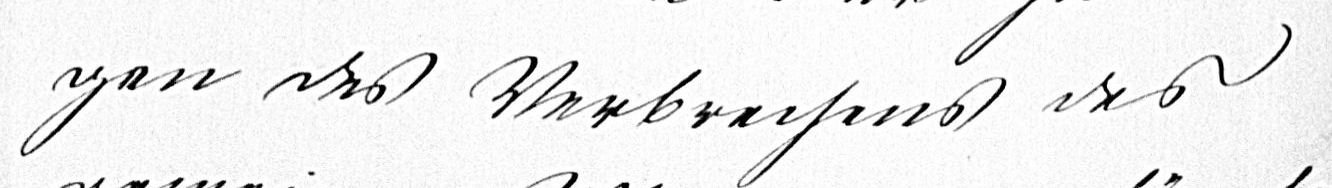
gen des Verbrechens des
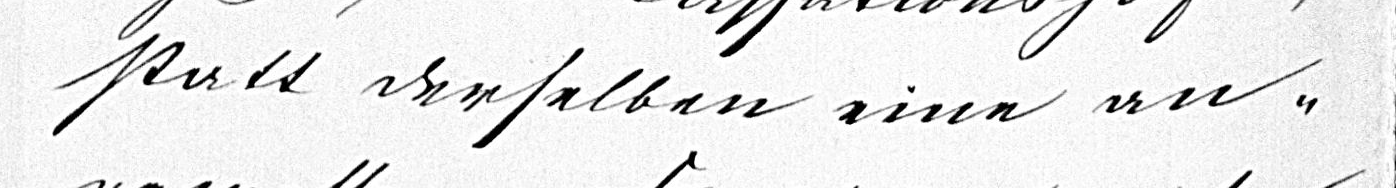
statt derselben eine an¬
